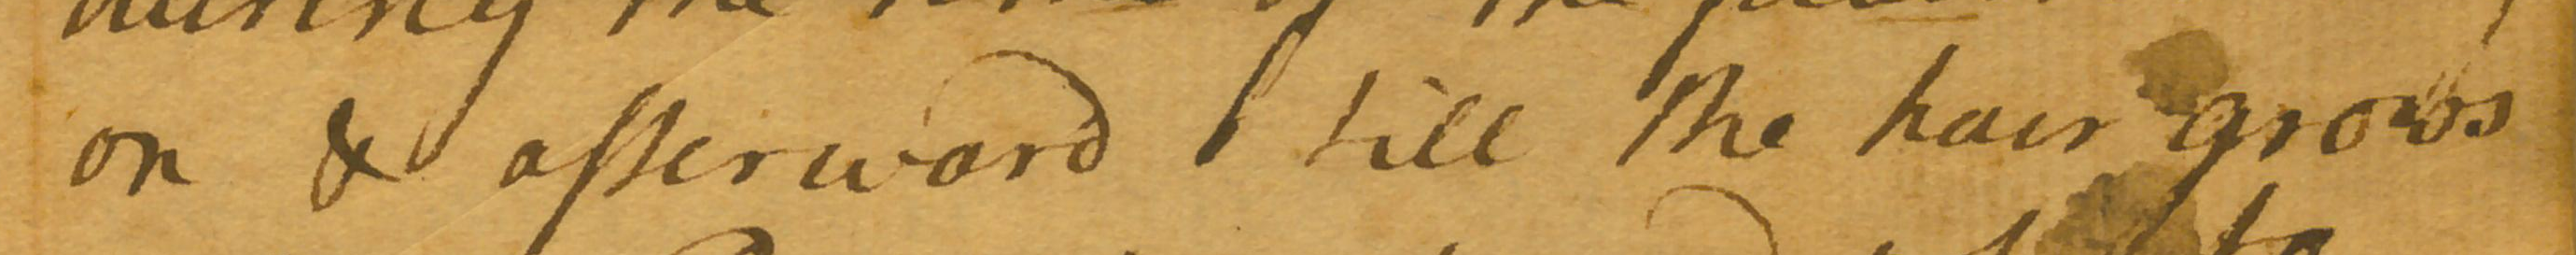on & afterward till the hair grows
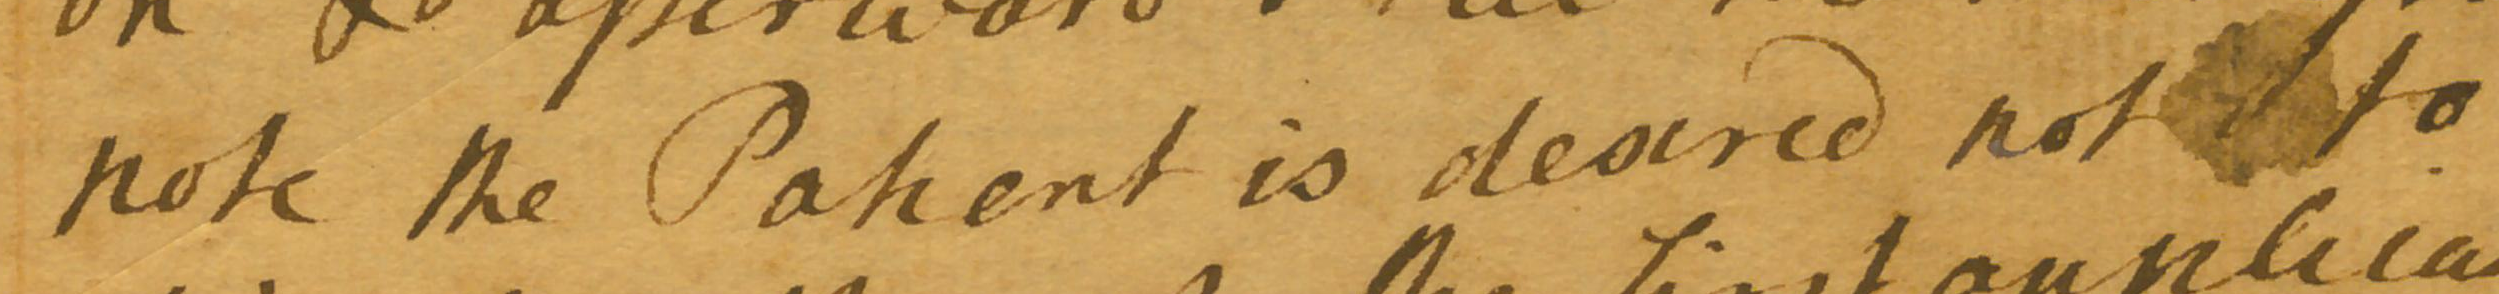note the Patient is desired not to
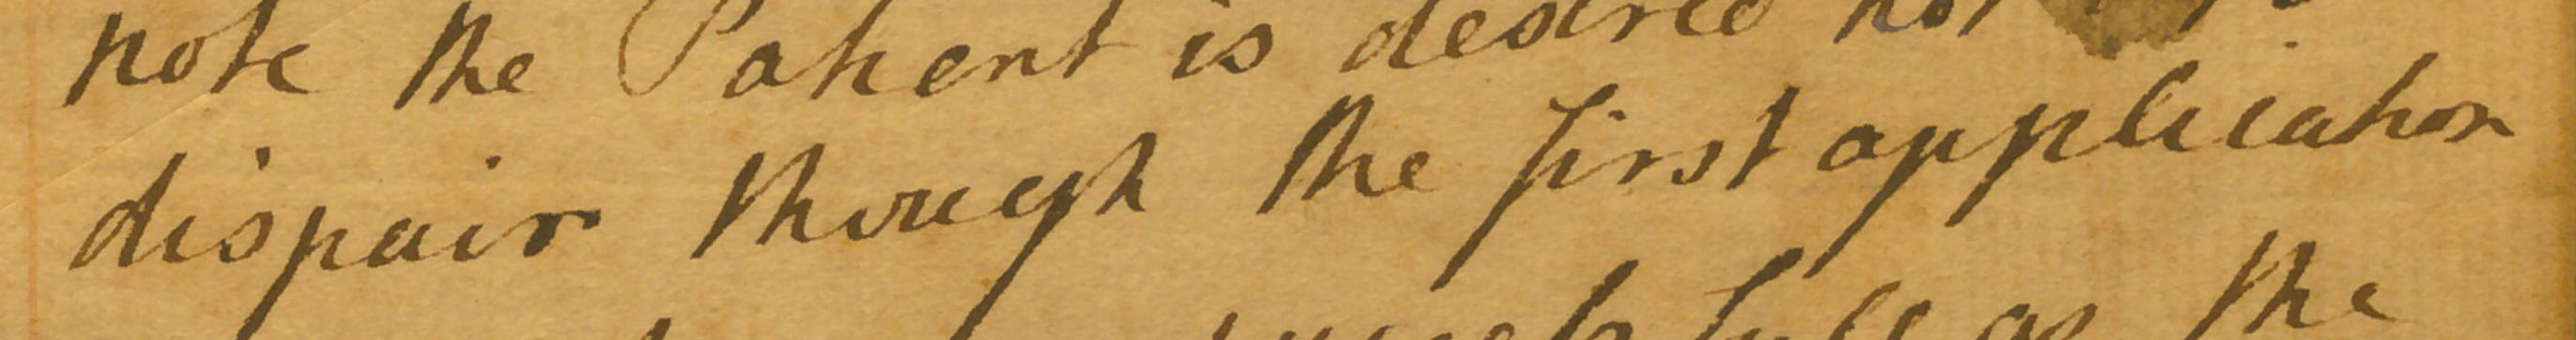dispair though the first application
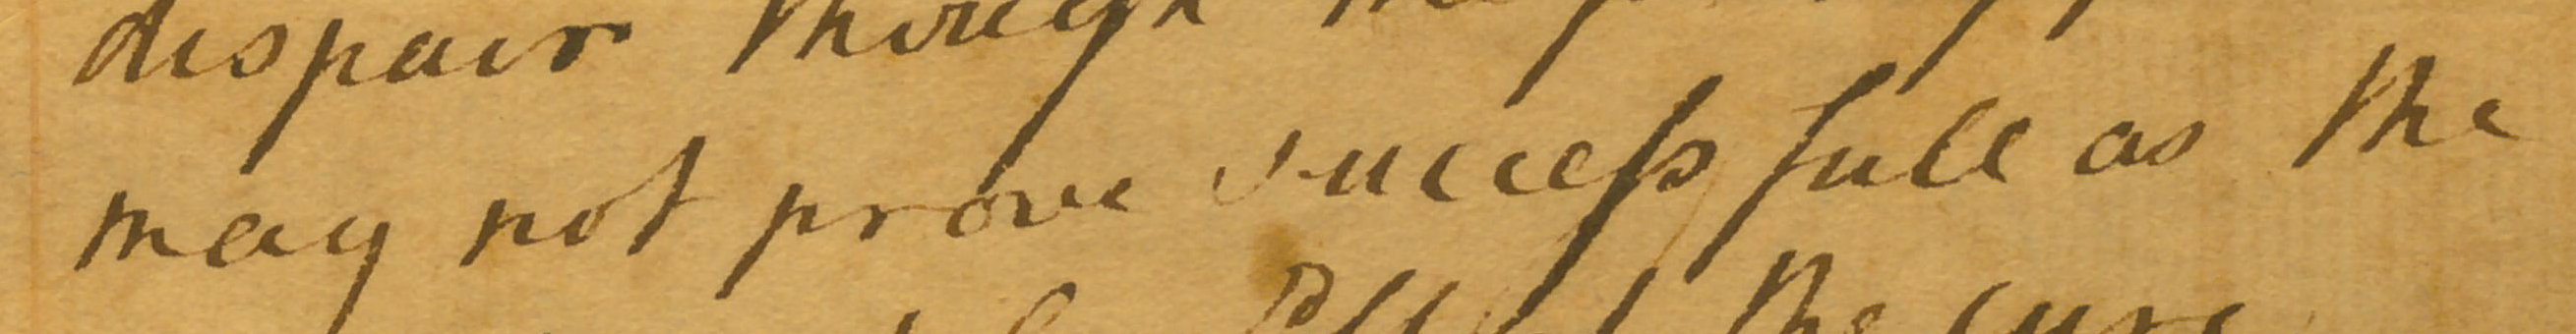may not prove successfull as the
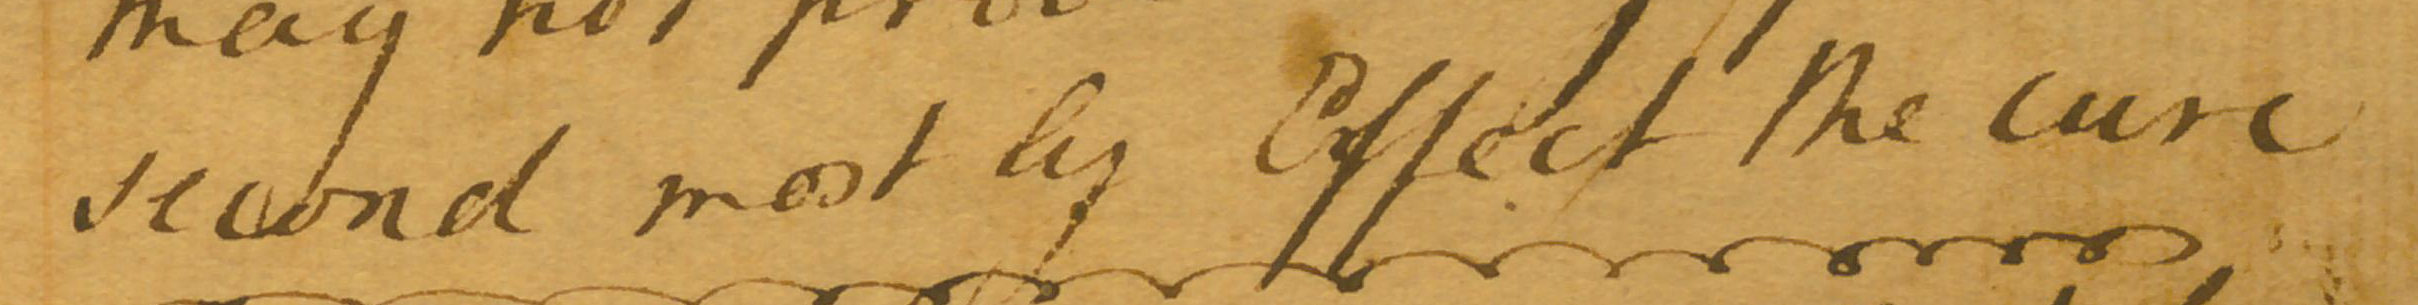second mostly Effect the cure
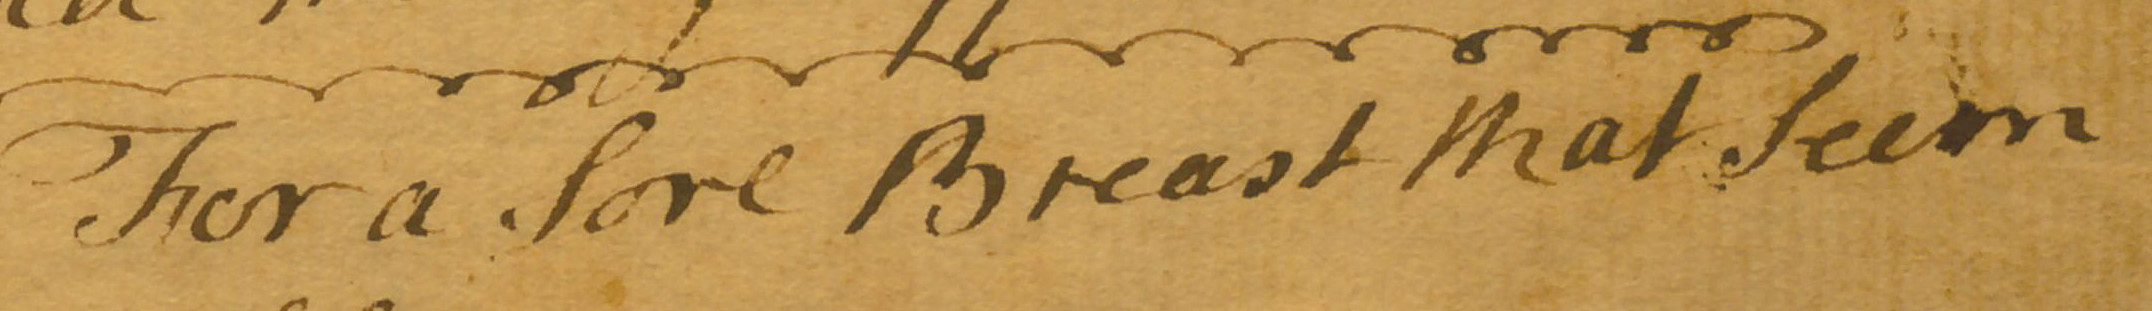For a sore Breast that seem
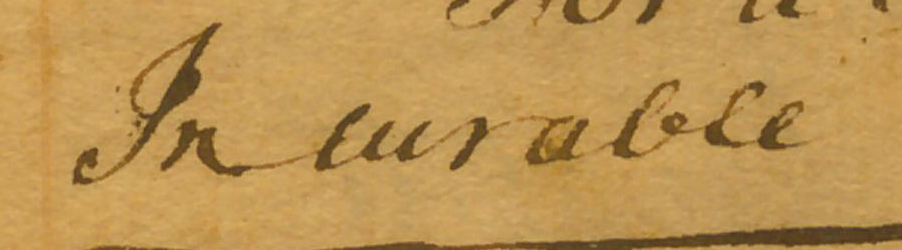Incurable
